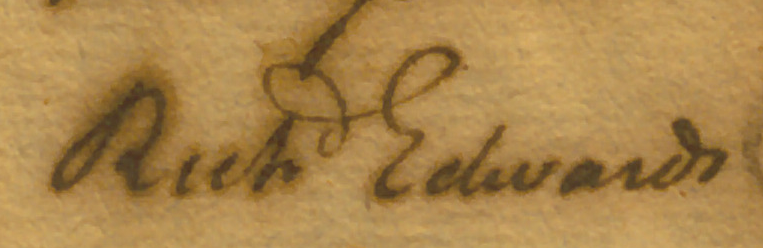Rich^d Edwards
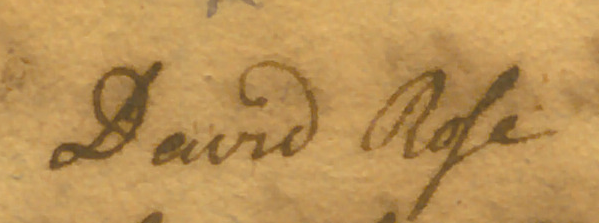David Rose
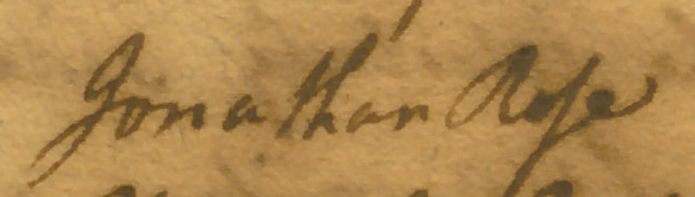Jonathan Rose
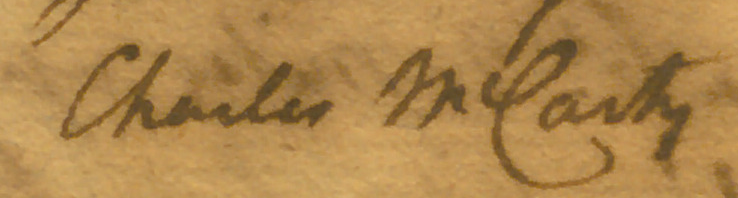Charles McCarty
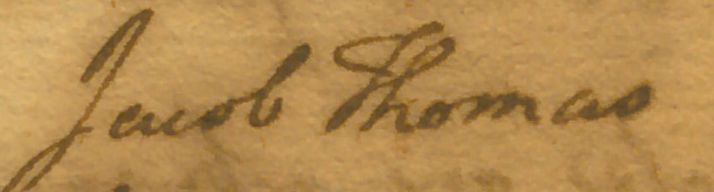Jacob Thomas
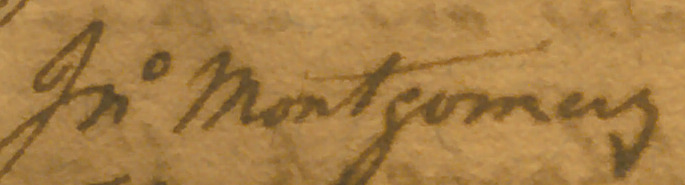Jn^o Montgomery
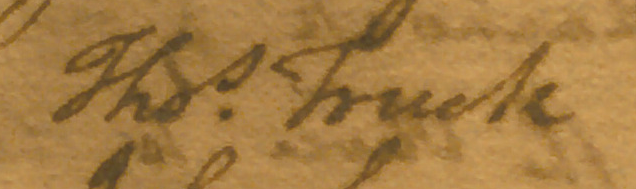Tho^s. Truck
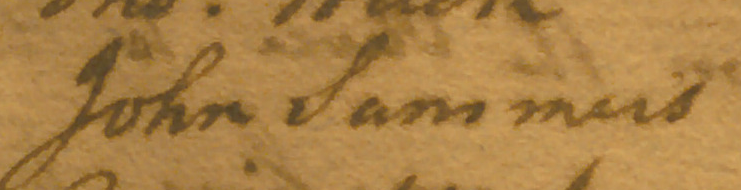John Summers
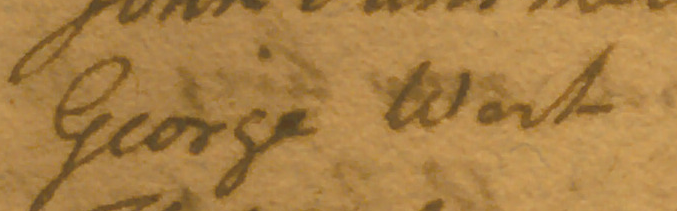George West
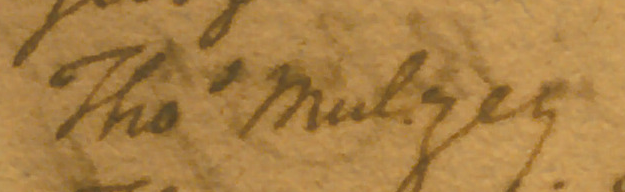Tho^s Mulzey
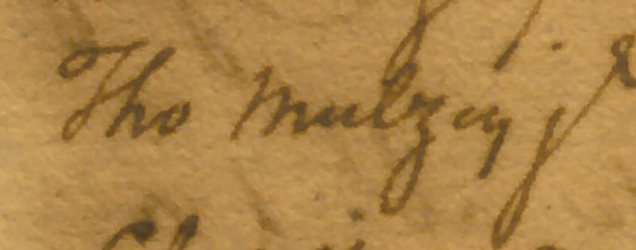Tho Mulzey j^r
